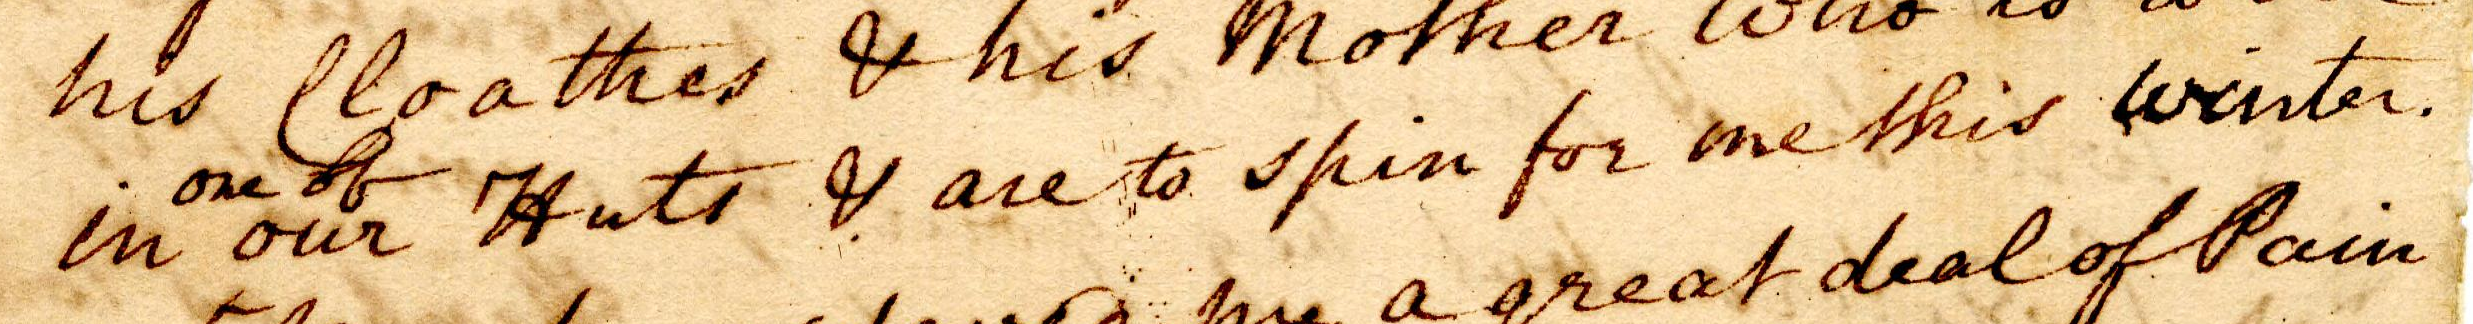in ^ our Huts & are to spin for me this winter.
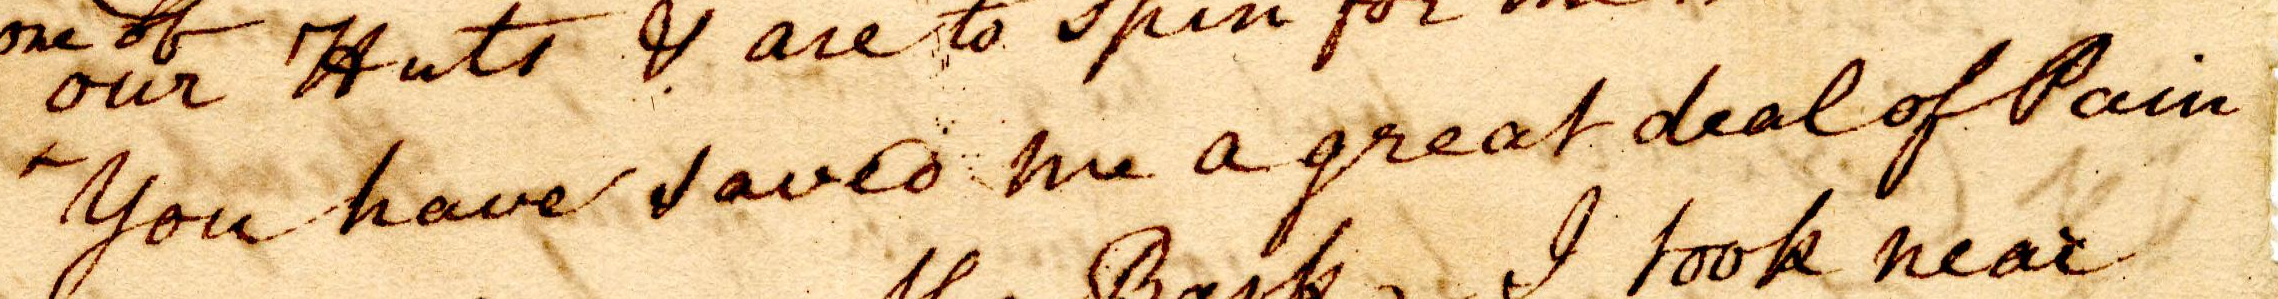You have saved me a great deal of Pain
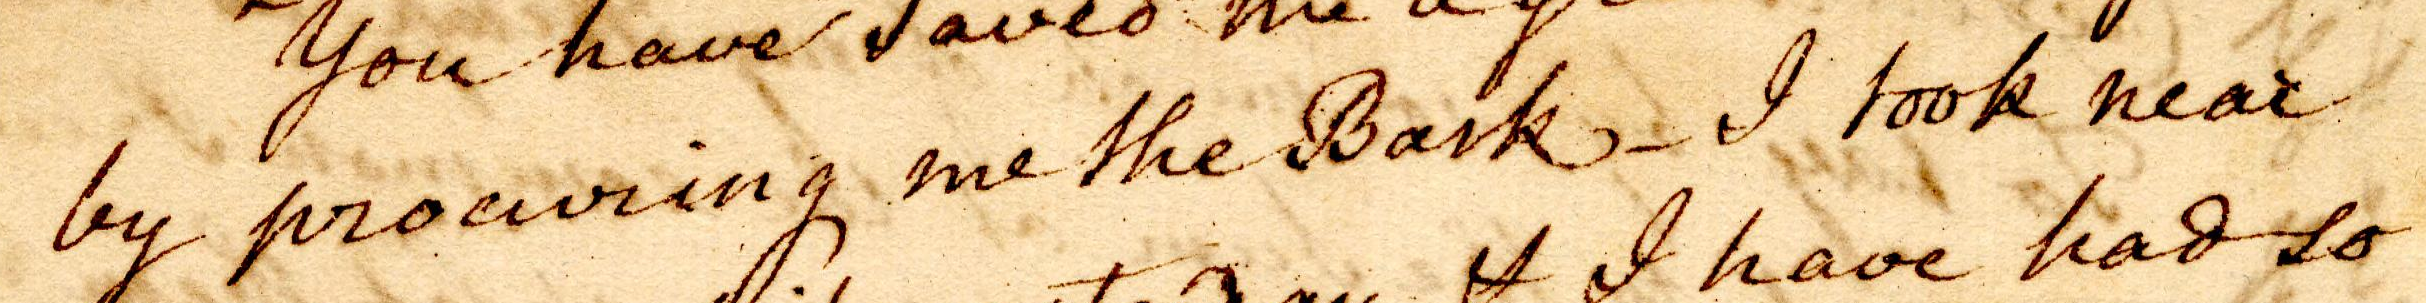by procuring me the Bark- I took near
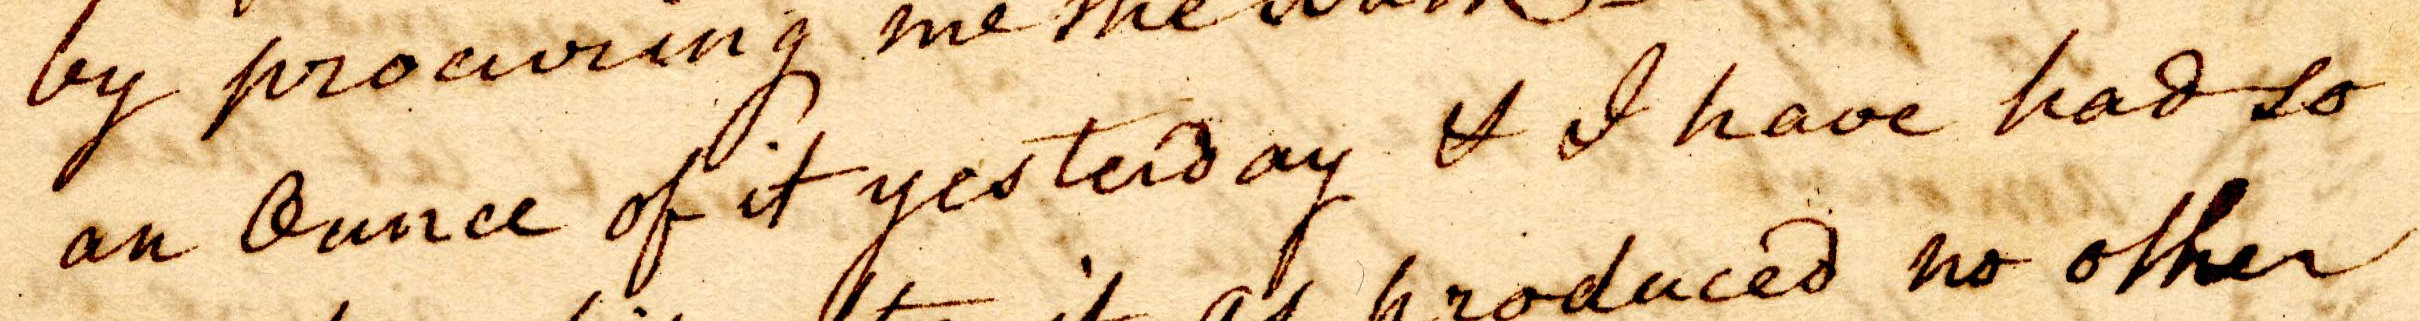an Ounce of it yesterday & I have had so
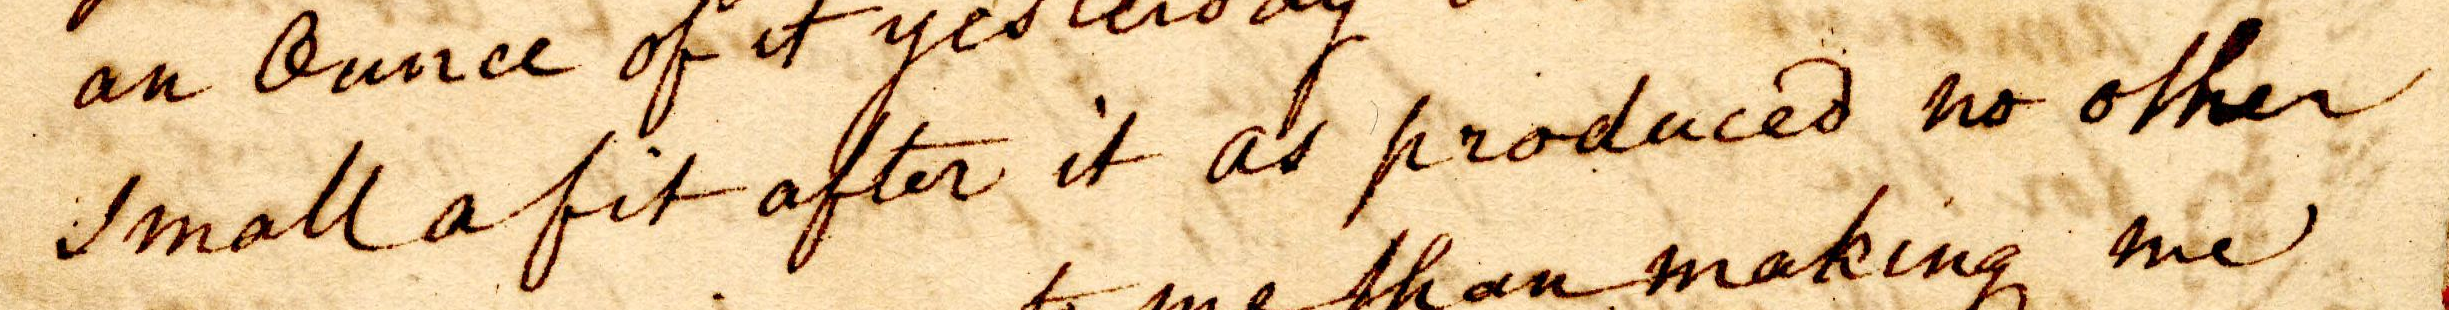small a fit after it as produced no other
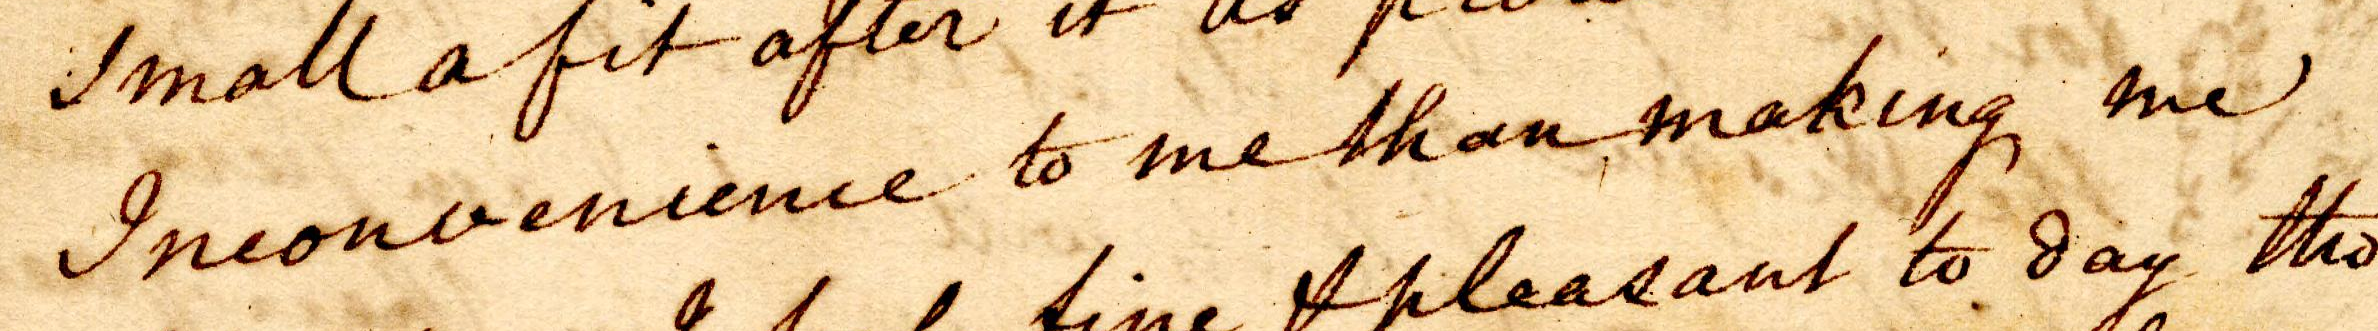Inconvenience to me than making me
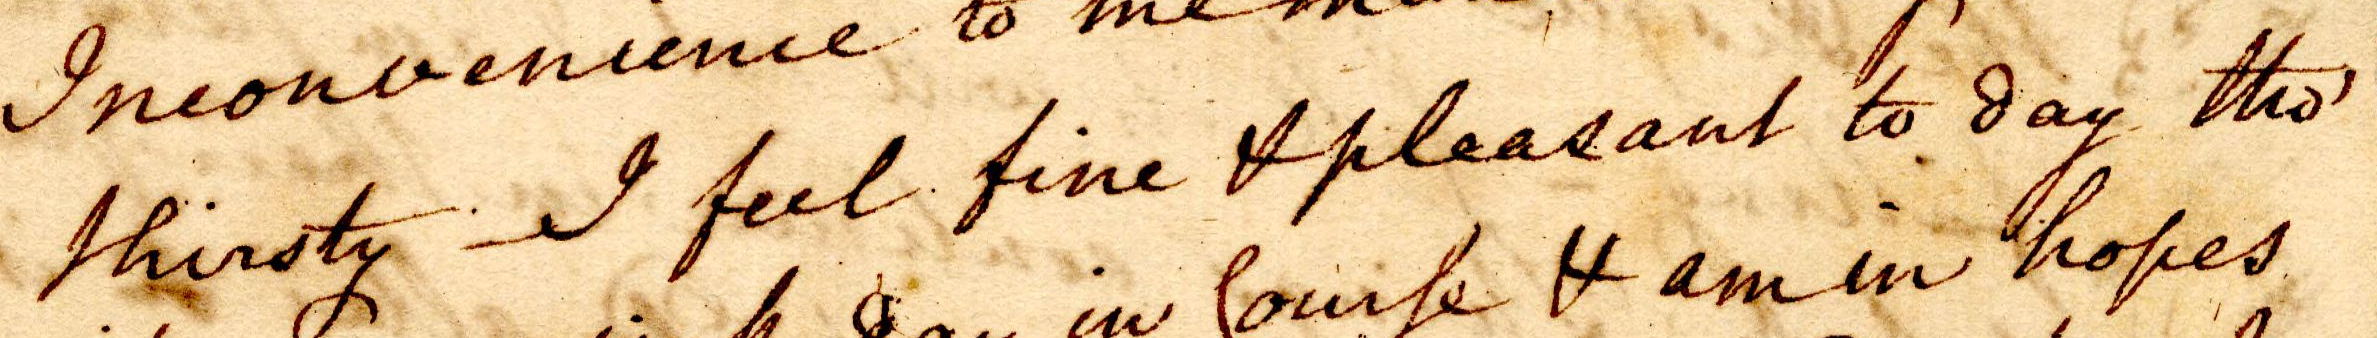thirsty -I feel fine & pleasant to day tho'
